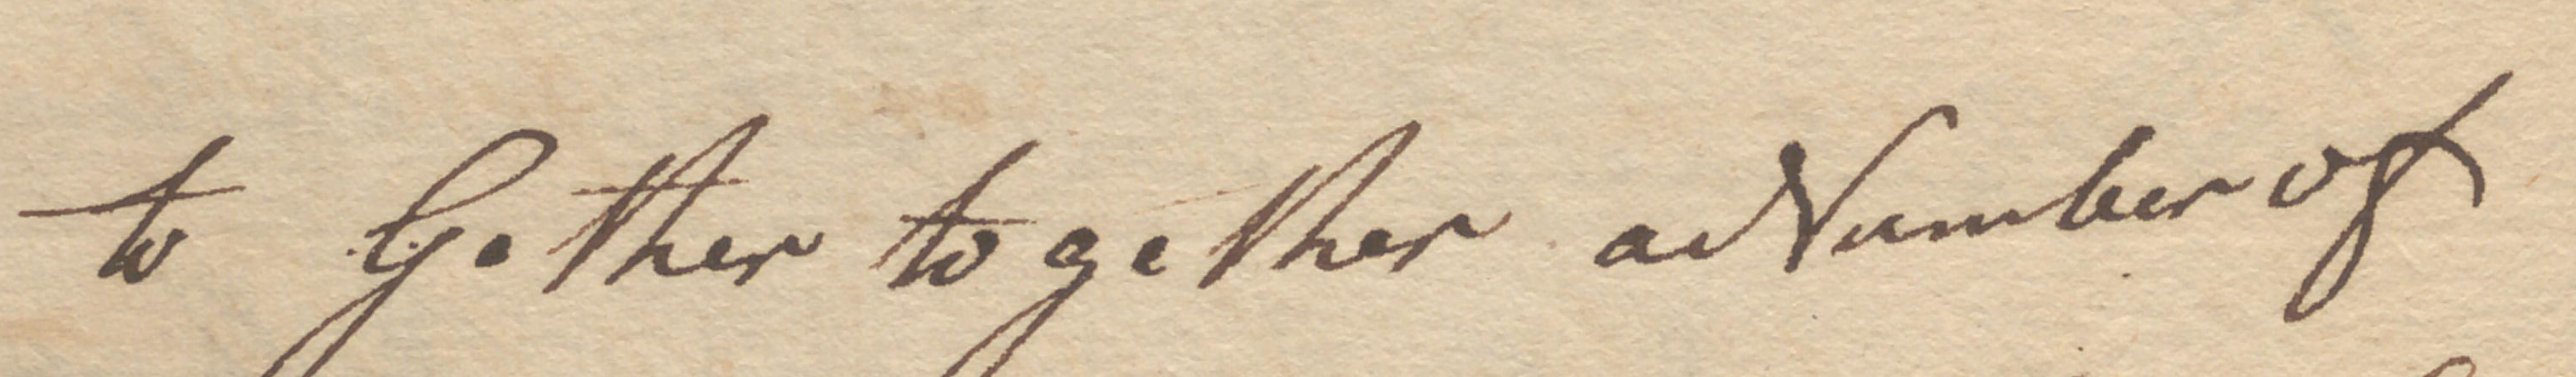to Go ther to gather a Number of
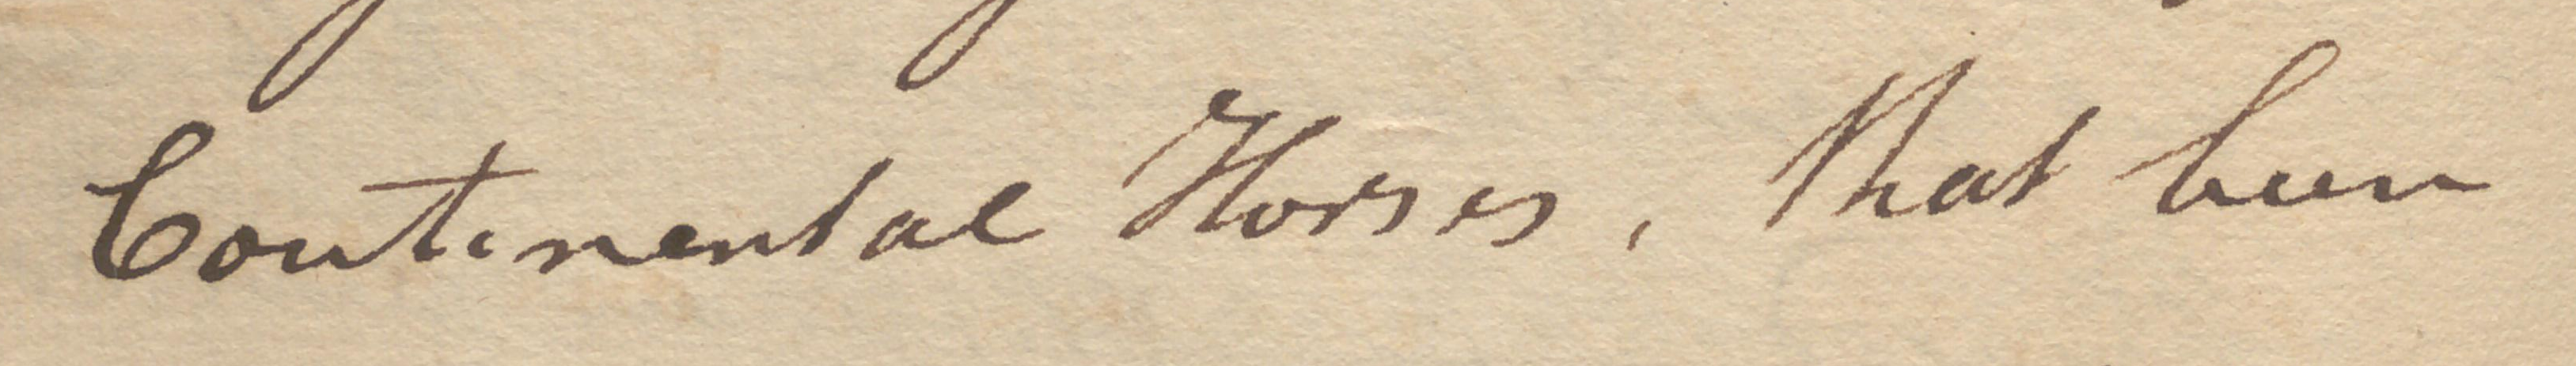Continental Horses, that been
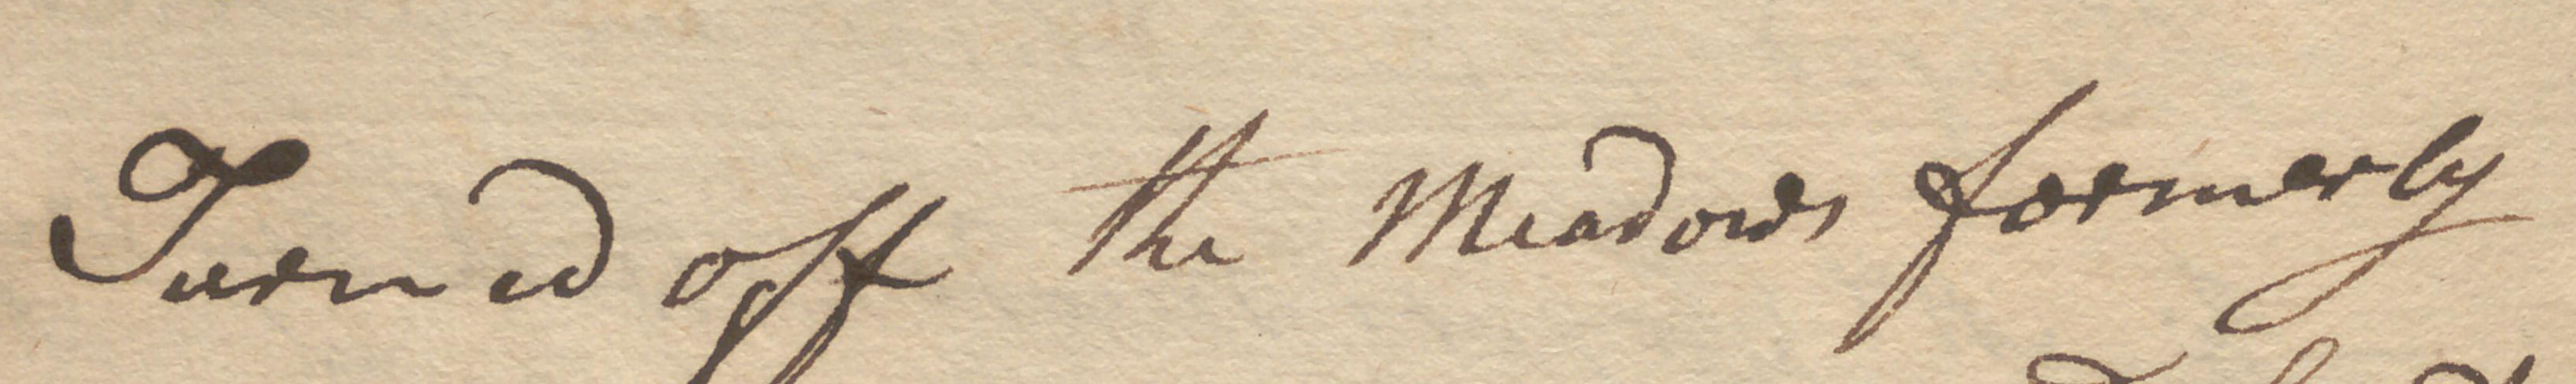Turned off the Meadows formerly
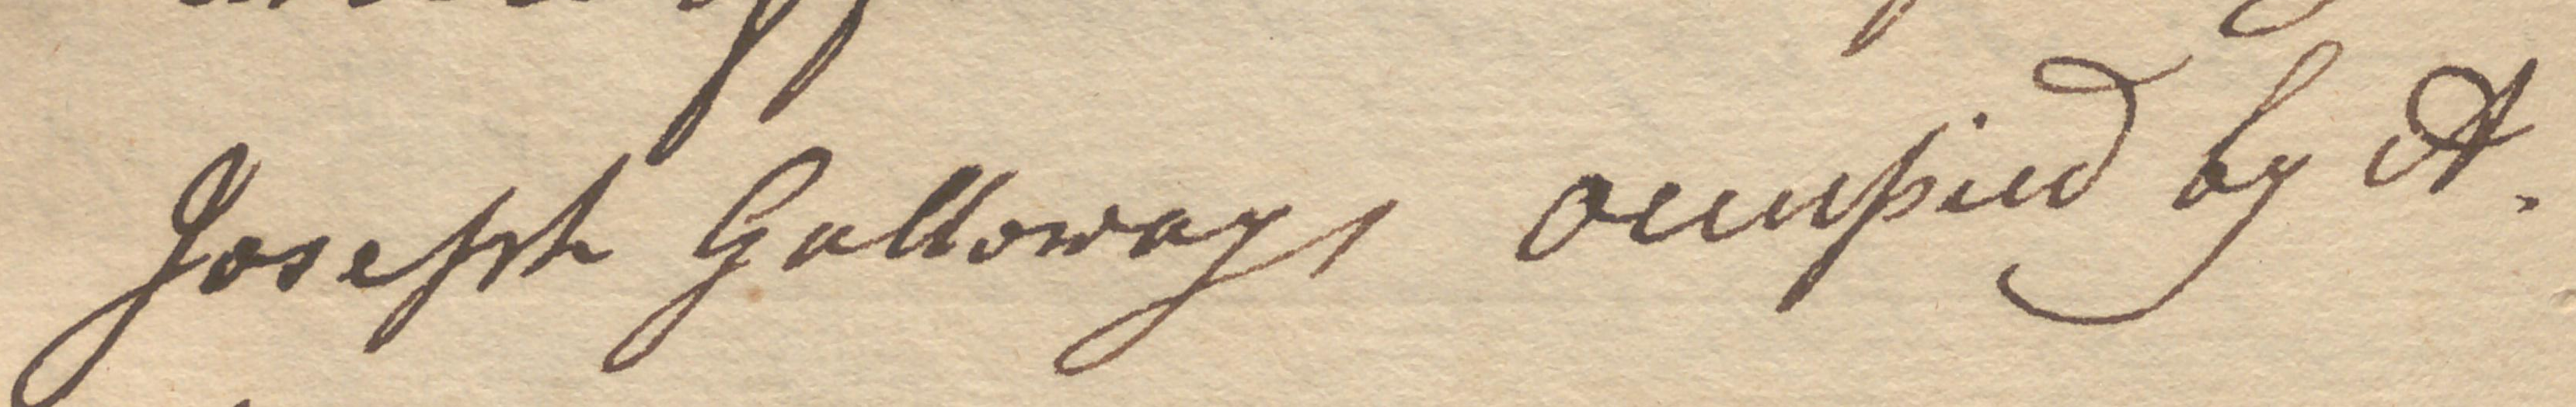Joseph Galloways occupied by A
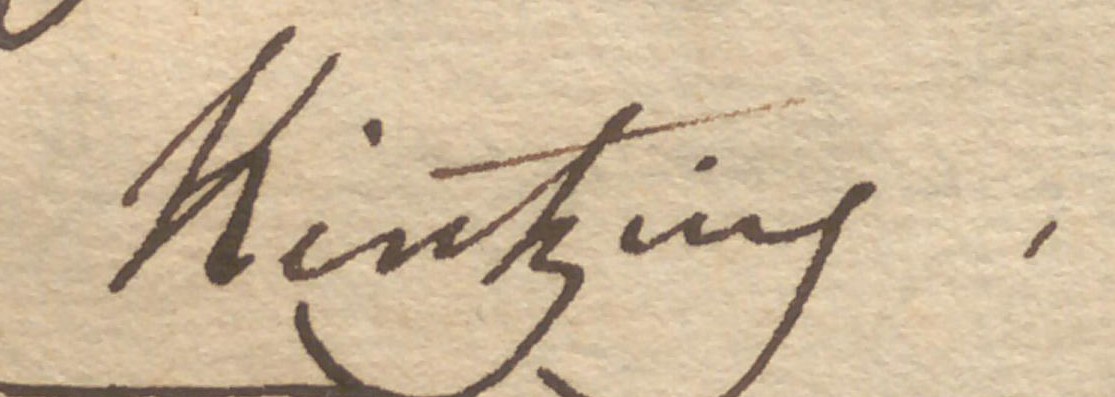Kintzing
